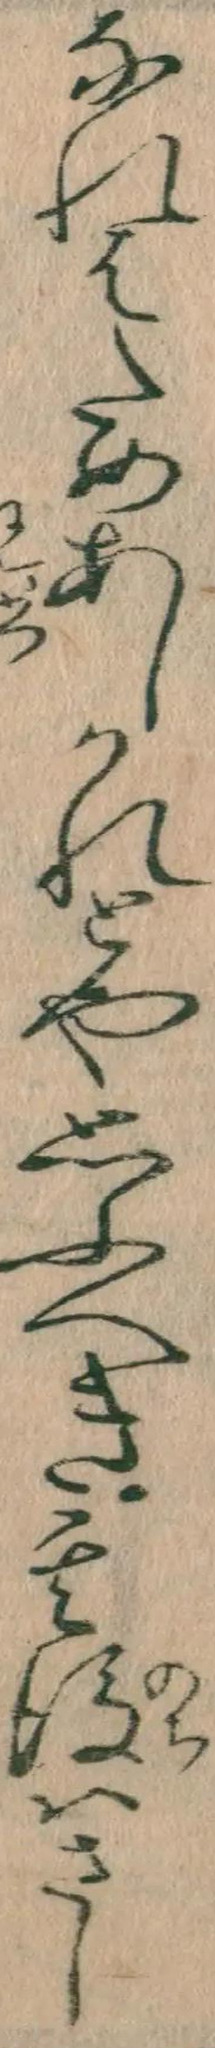なれはためあしかれとや思ふへき、其後はさし
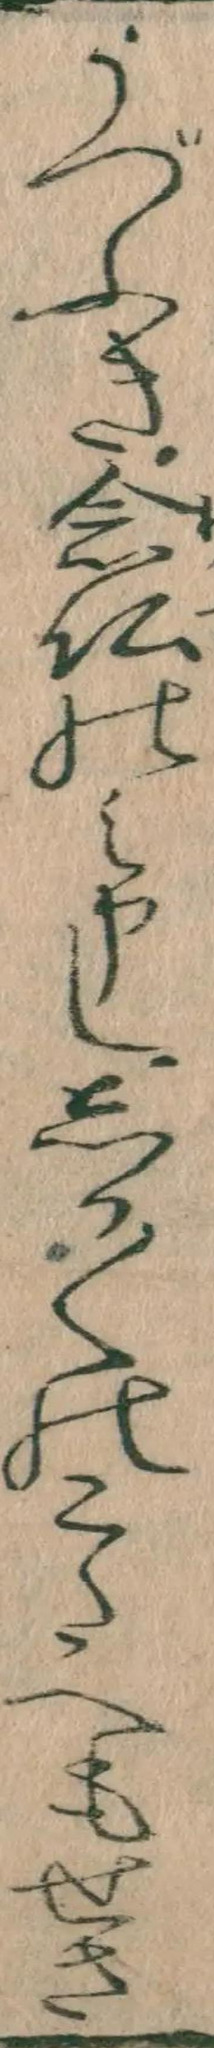うづふき、念仏のみ申し。しか〳〵のこたへもせさ
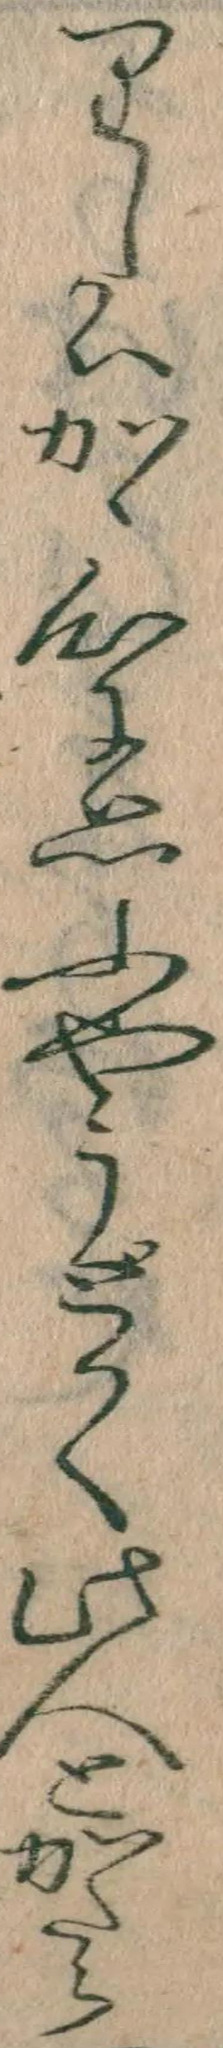りしかはかゝ心に思ふやう。とかく此人とかたら
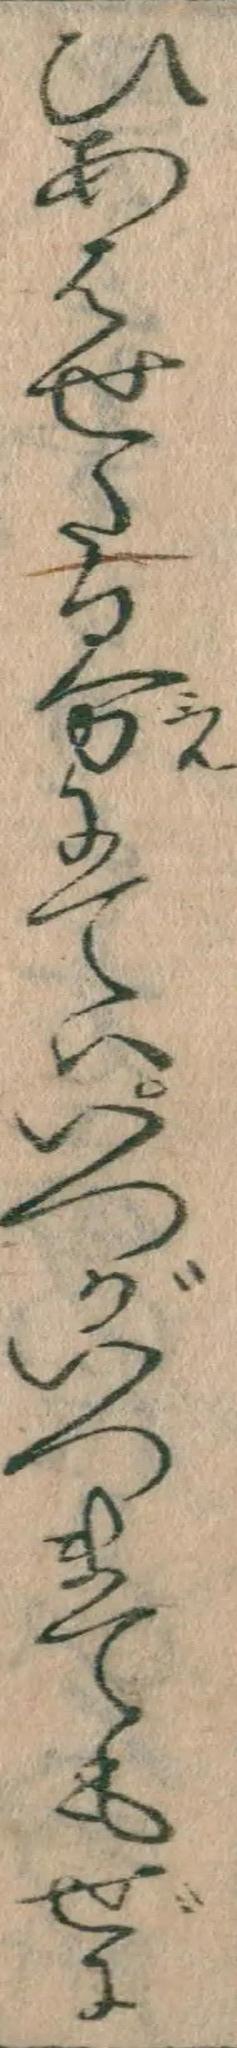ひあはせたる分にては。いつがいつまてもぜに
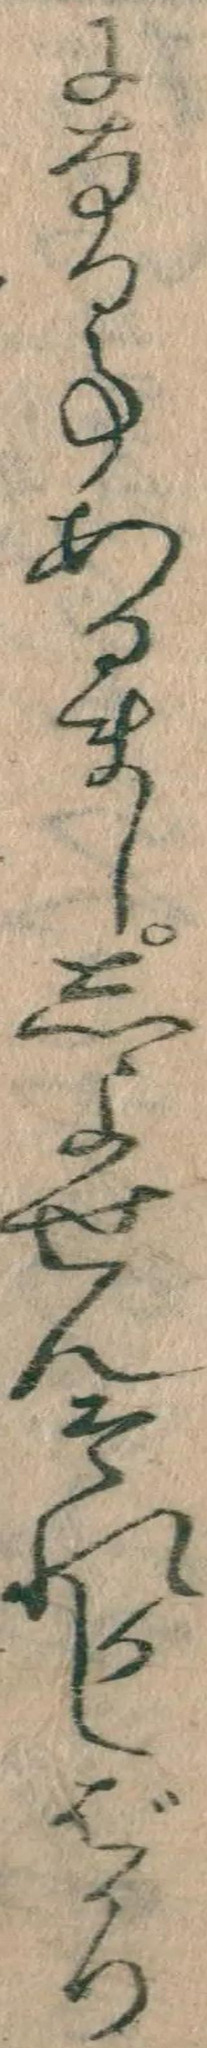になる事あるまし。しよせんそれかしばかり
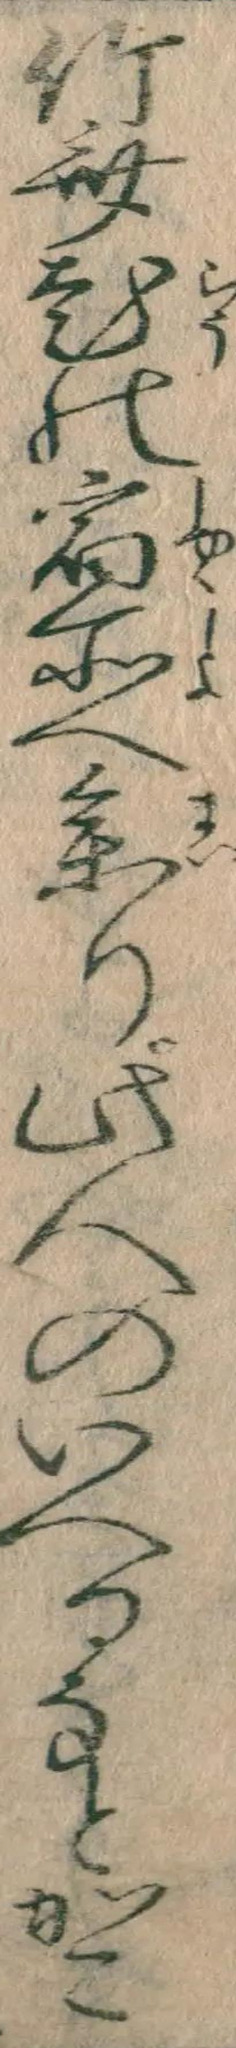竹斎老の宿所へ参り。此人のいへるなとかこ
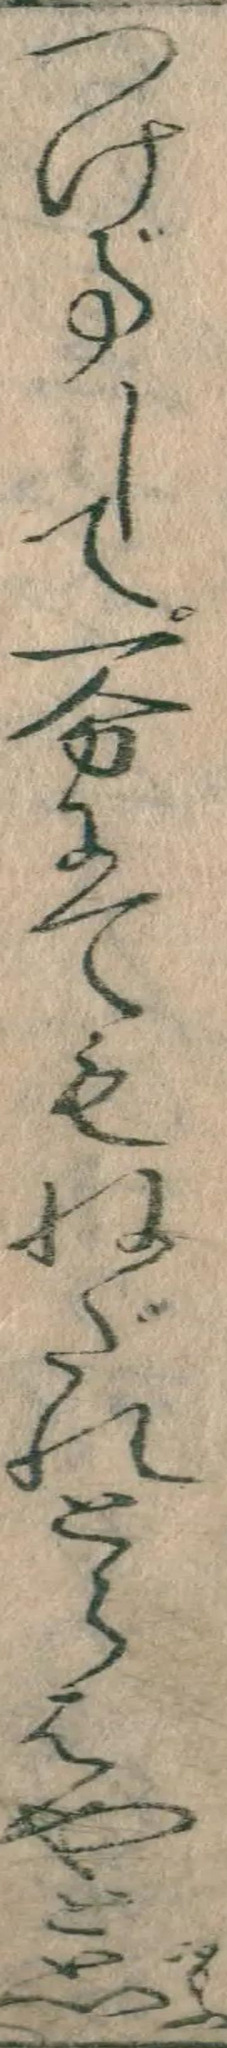つけ”事して。一分にてもねだれとらはやと思
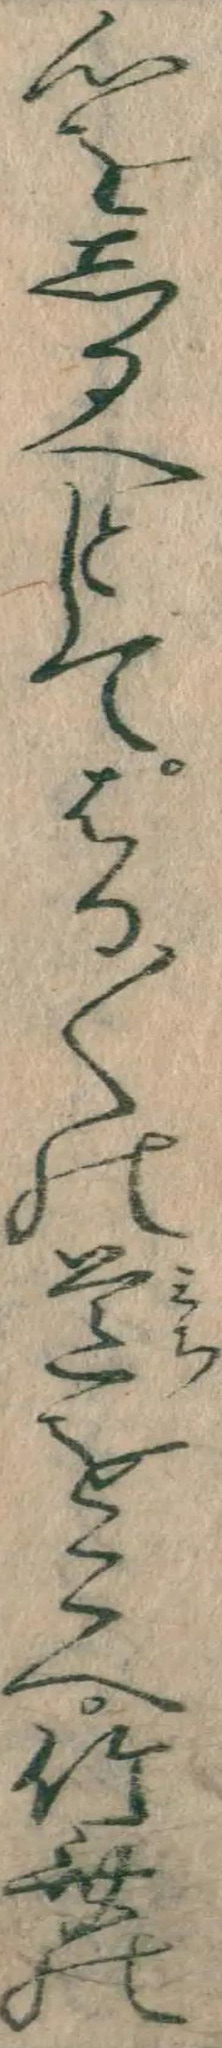心をしるへとして。はる〳〵の道をこへ。竹斎の
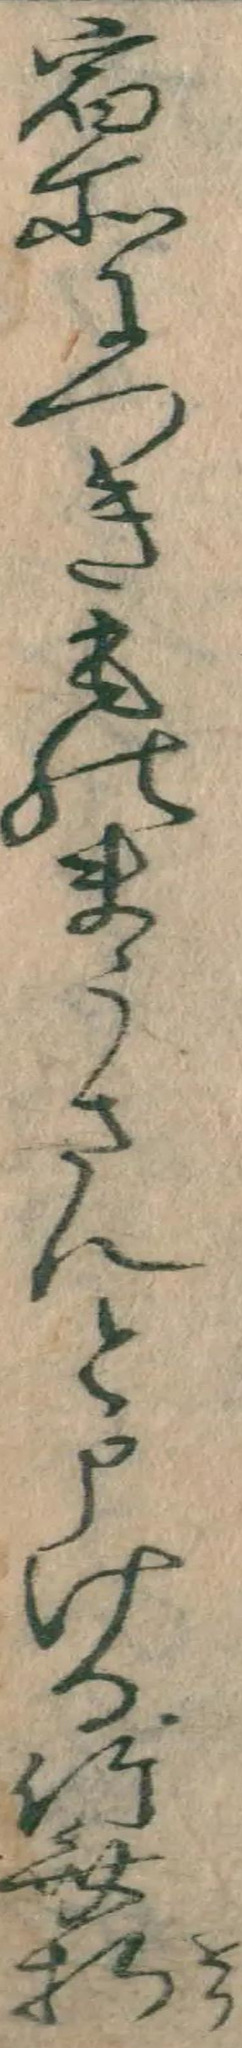宿所につきものまうさんと申しける、竹斎折

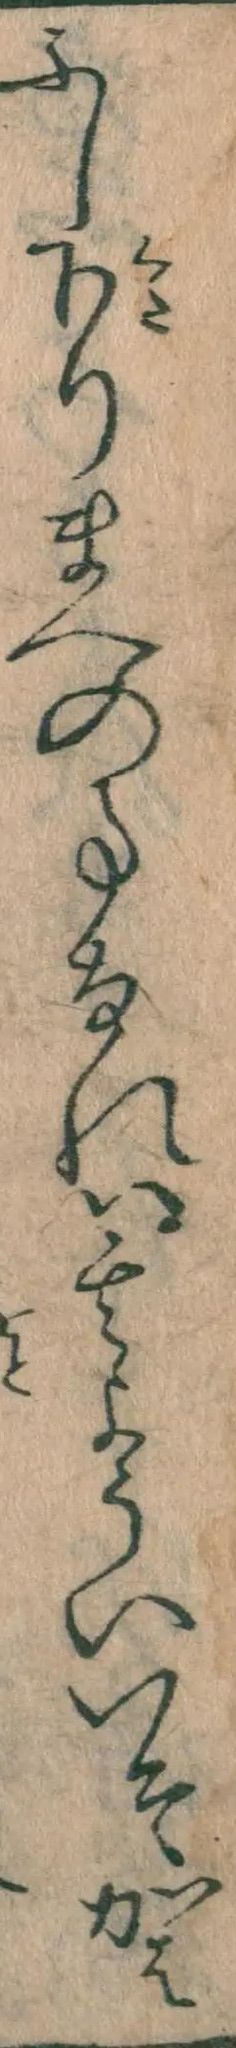ふし下りまへの事なれは其よういいそかは
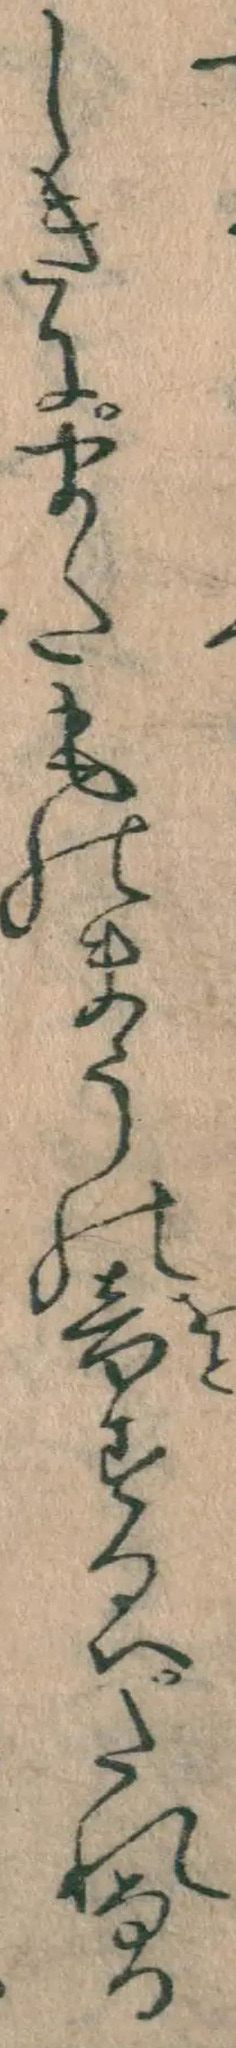しきに。またものまうの音するは。たれなる
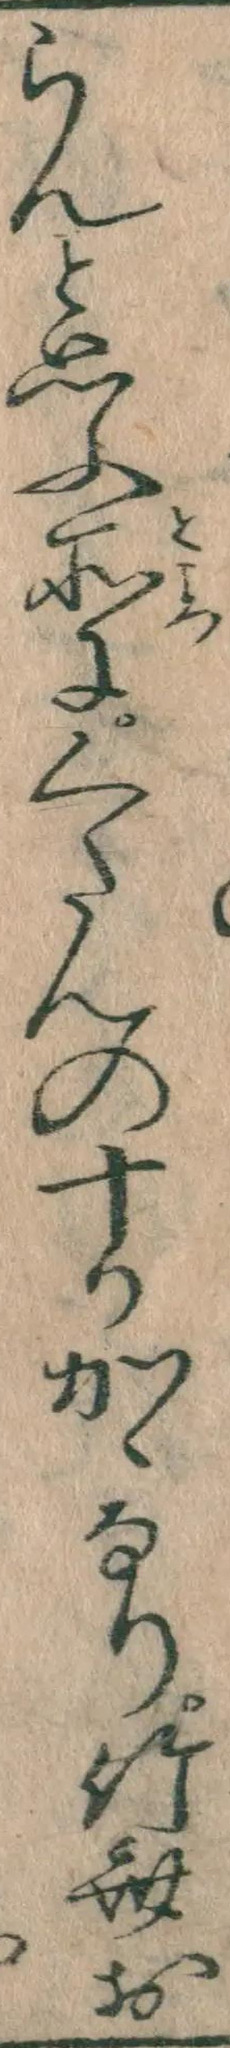らんと思ふ所に。くたんの十かかゝなり。竹斎お
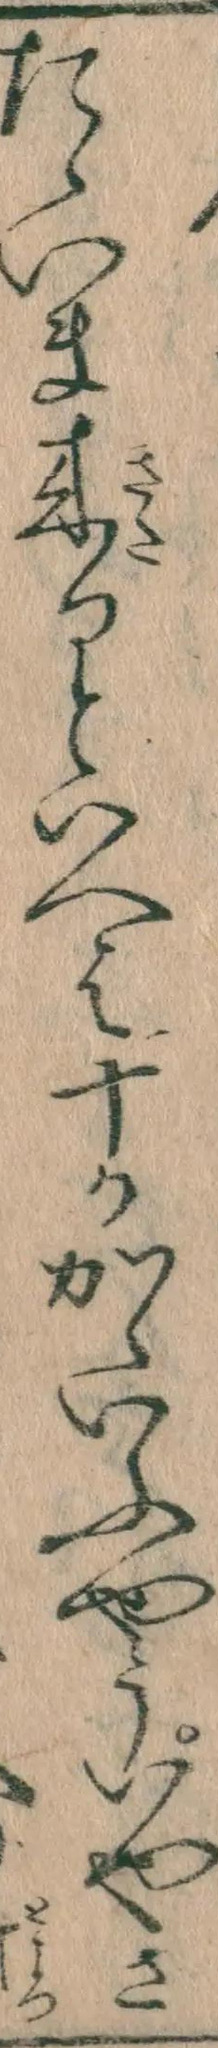たゝいま来るといへは十かかゝいふやう。いやさ
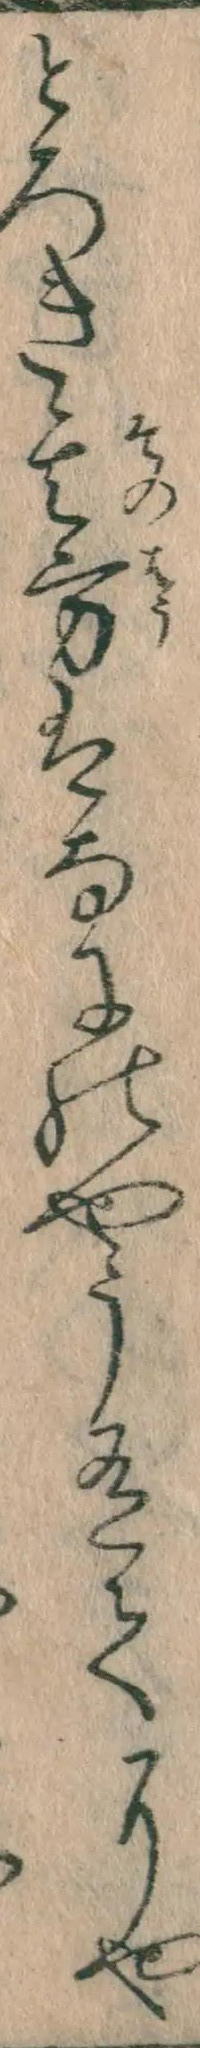とろき其方はなにのやう有てにや
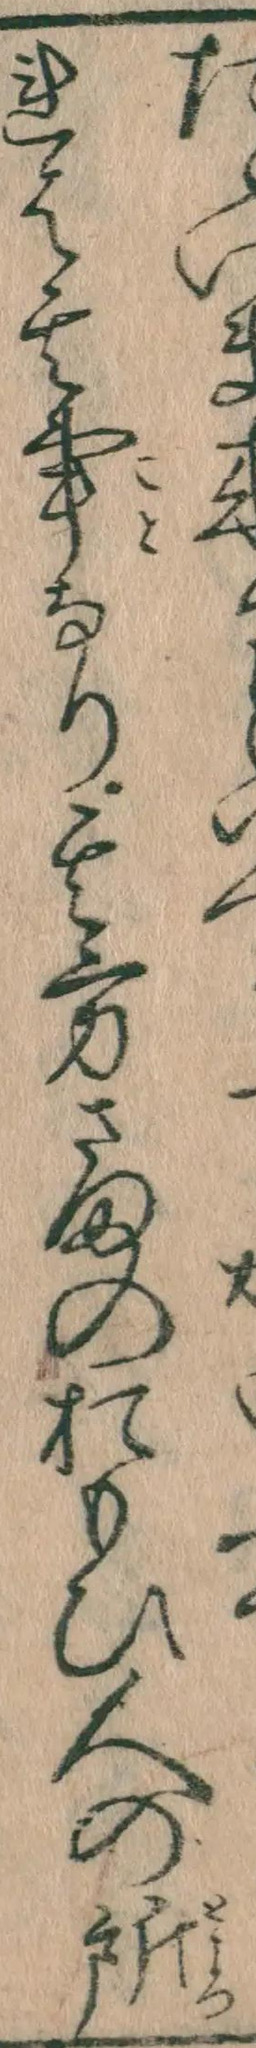れは其事なり、其方さまのおもひ人の所
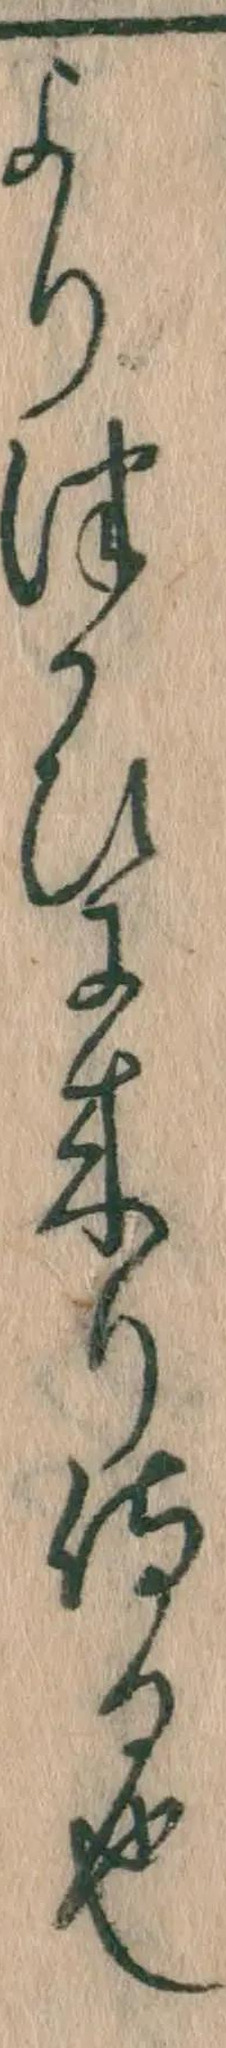よりつかひに来り侍る也
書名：竹斎狂歌物語 3巻
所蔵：国立国会図書館 National Diet Library, JAPAN
